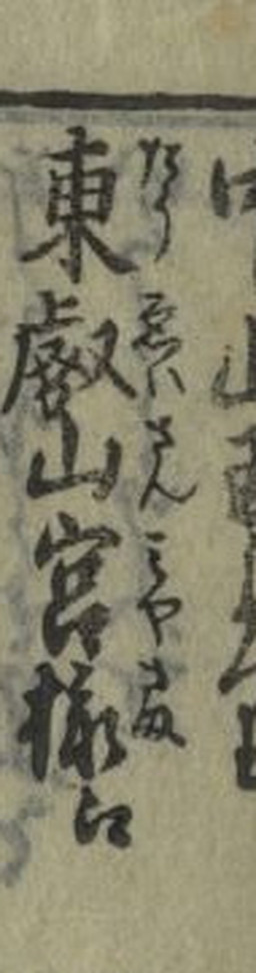東叡山宮様え
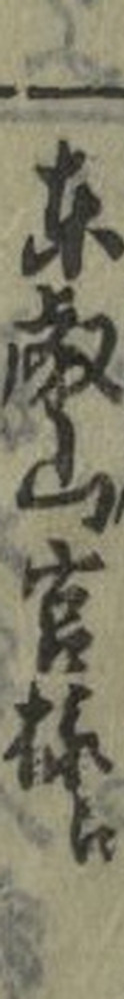東叡山宮様え
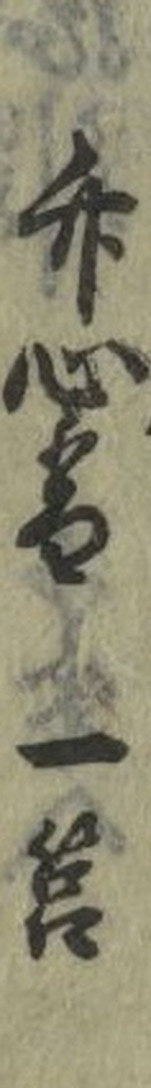竹心香一箱
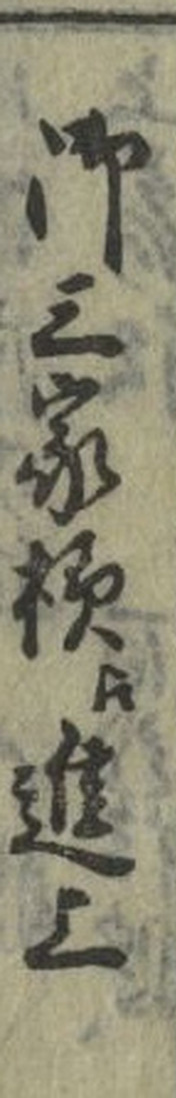御三家様え進上
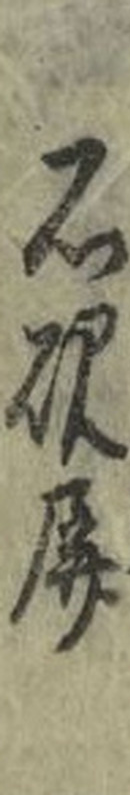石硯屏
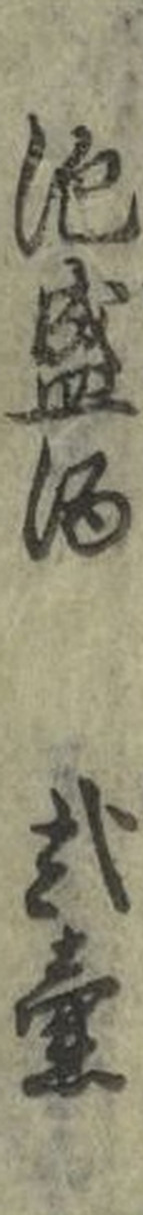泡盛酒弐壺

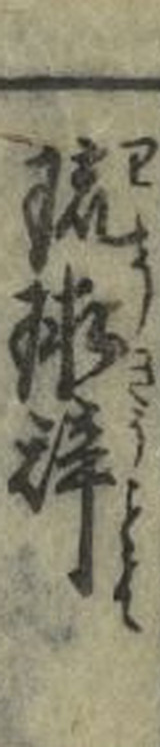琉球辞
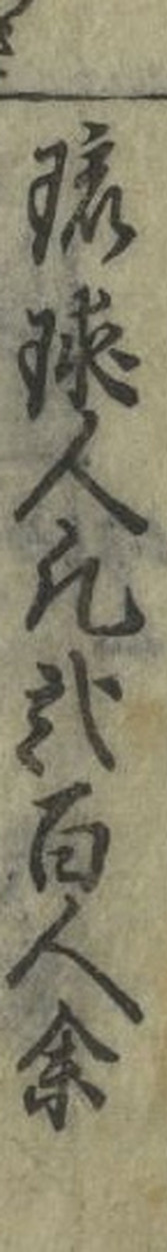琉球人凡弐百人余
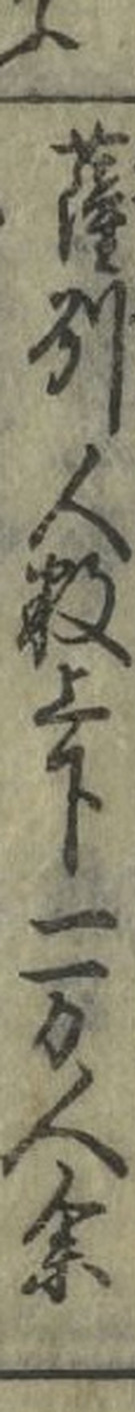薩州人数上下一万人余
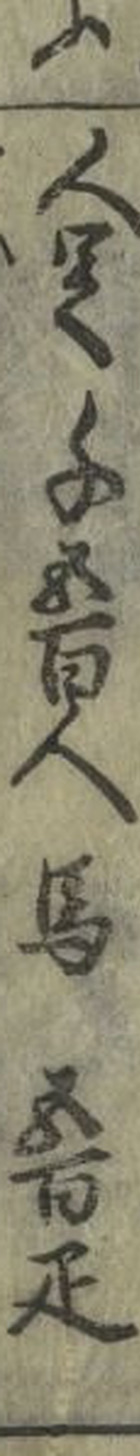人足千五百人馬五百疋
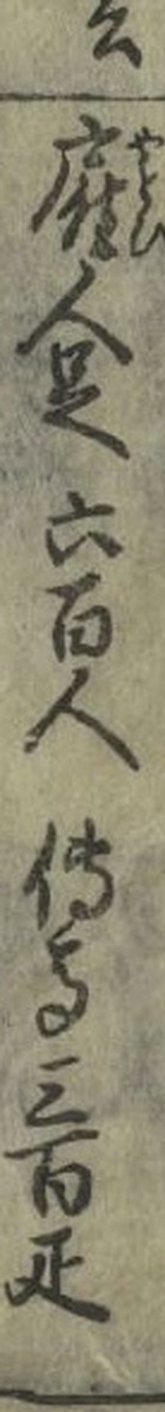雇人足六百人傳馬三百疋
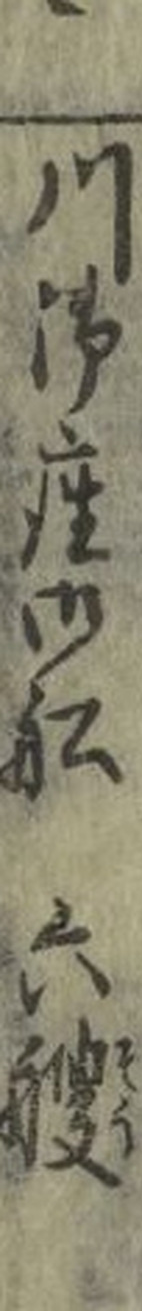川御座御船六艘
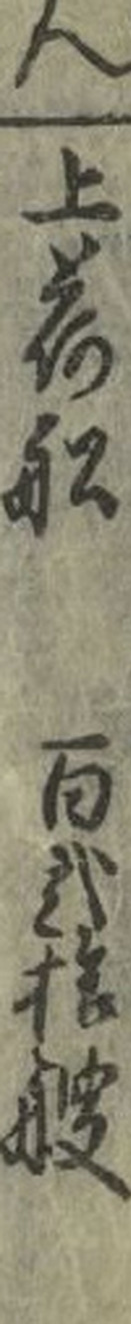上荷船百弐拾艘
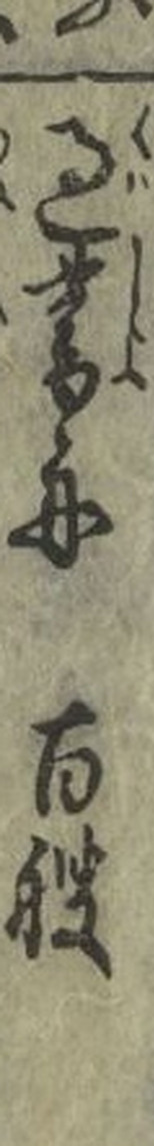過書舟百艘
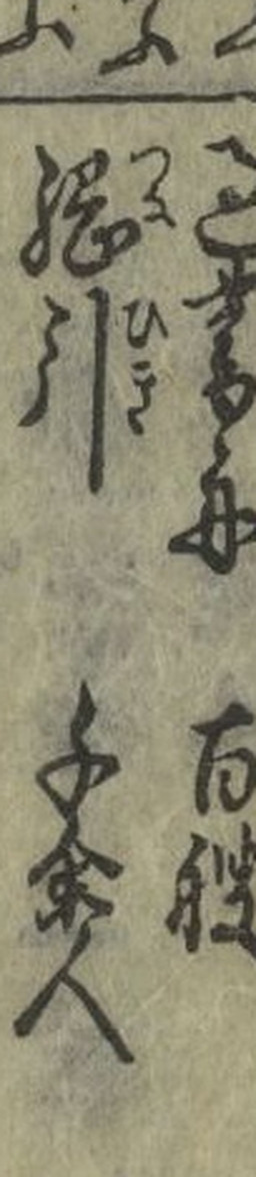綱引千余人
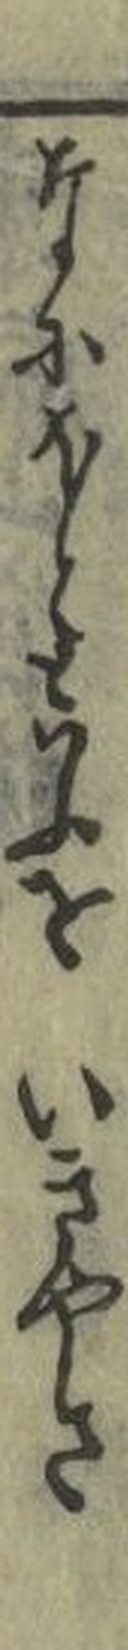なるほとといふをいきやき
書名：琉球人大行列記
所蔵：University of the Ryukyus Library
